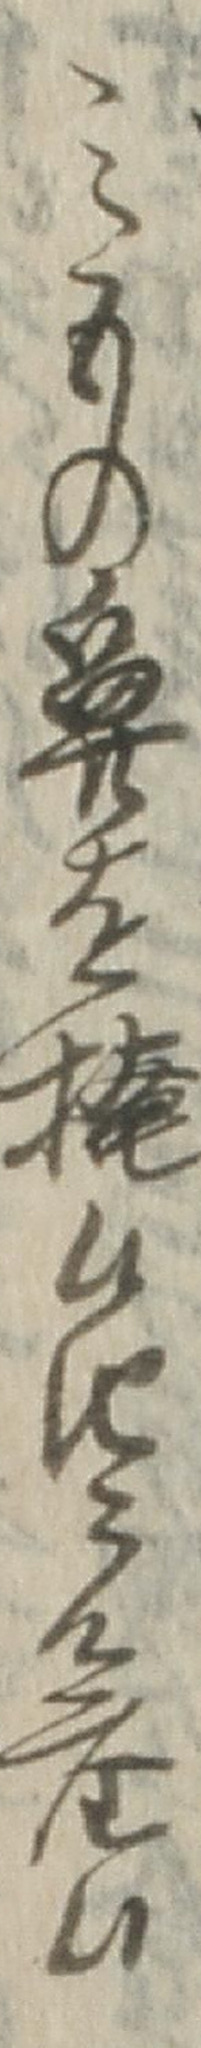之もの鼻を掩候由二御座候
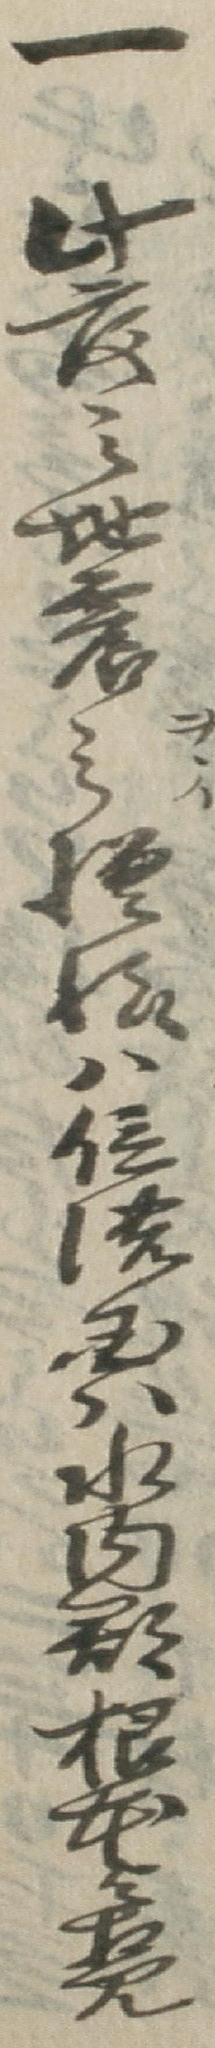一此度之地震之摸様ハ信濃国ハ水内郡根本と相見
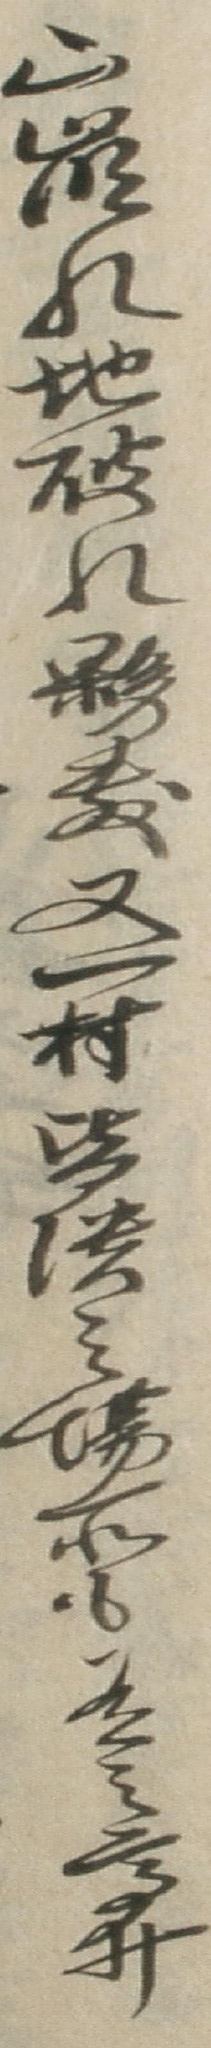山崩れ地破れ夥敷又一村皆潰之場所も有之高井
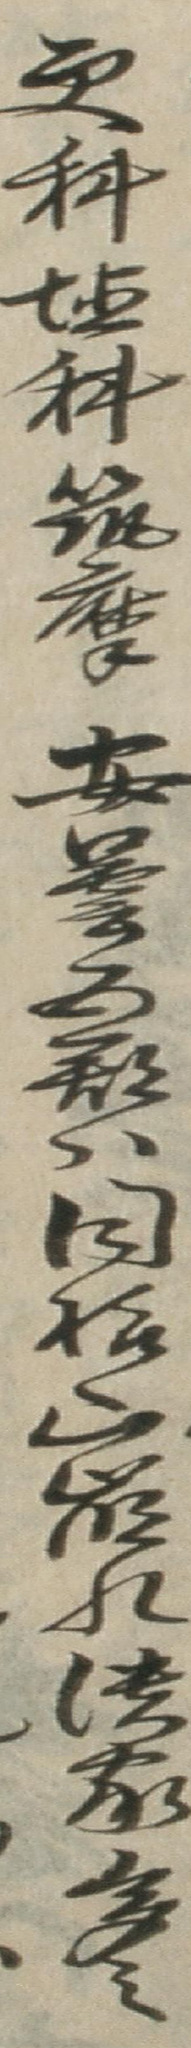更級埴科筑摩安曇五郡ハ同様山崩潰家多之
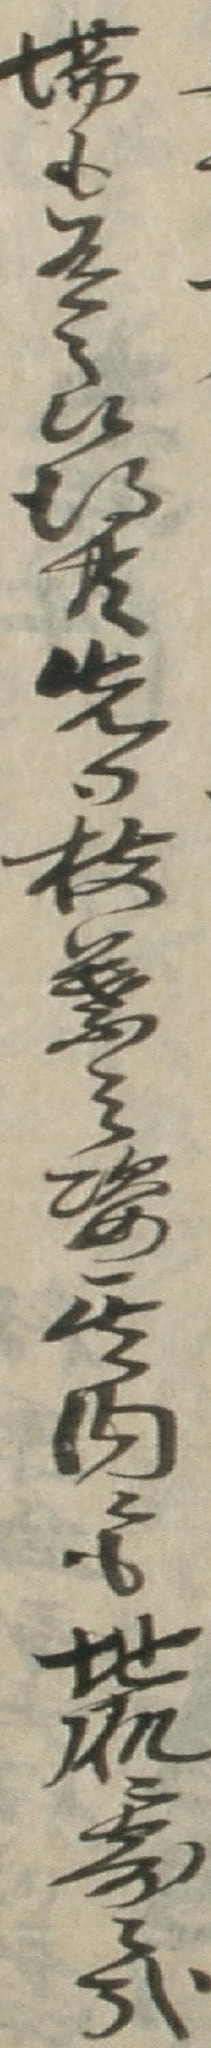場も有之候得共先ツ枝葉之姿其内にも地肌二寄候哉
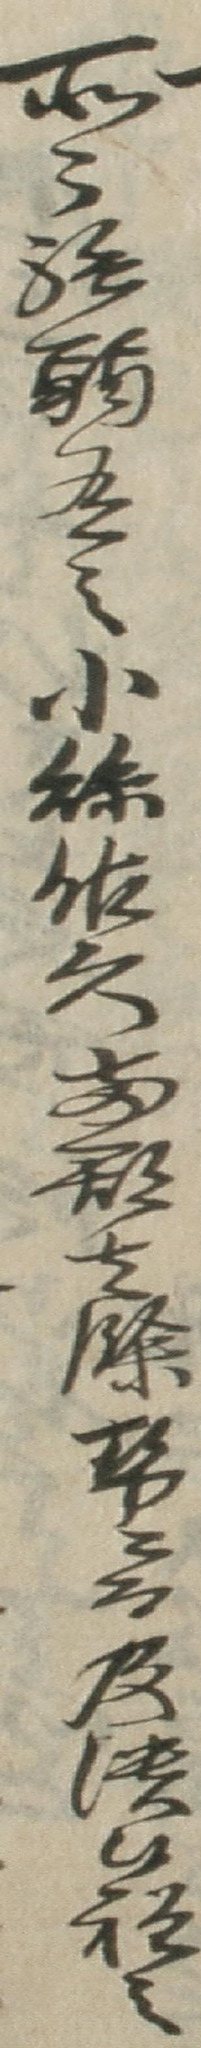所々強弱有之小県佐久両郡は餘勢二而及潰候程之
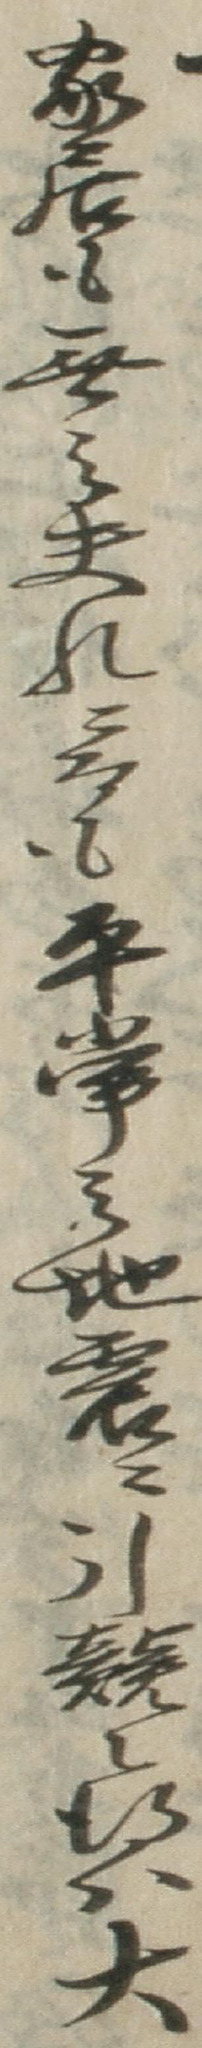家居も無之夫れ二而も平常之地震二引競候得ハ大
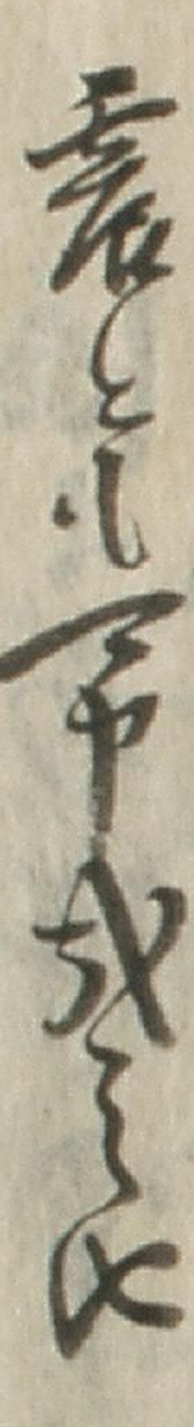地震とも可申哉之由
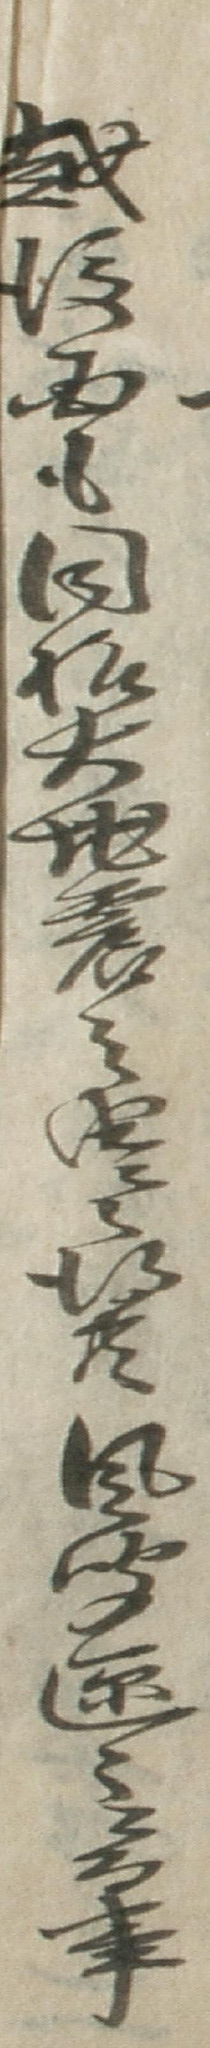一越後国も同様大地震之由二候得共風聞区々二而事
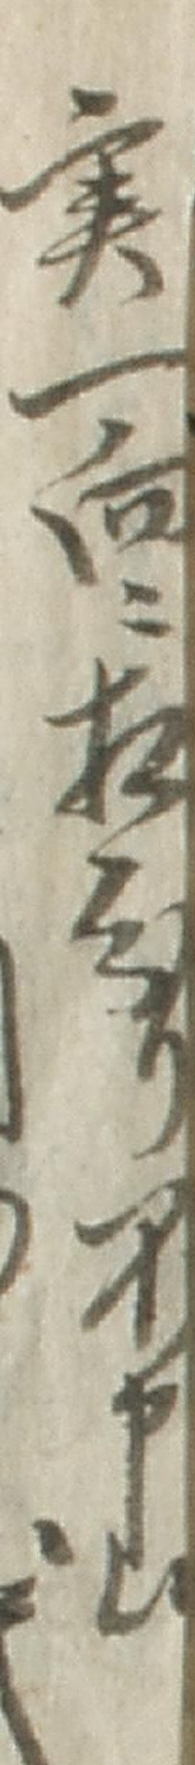実一向二相分り不申候

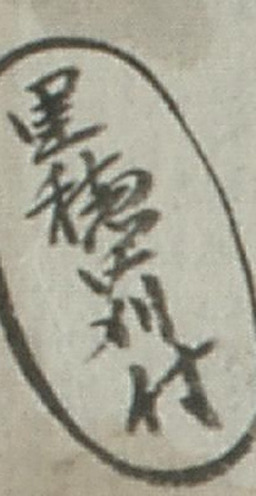里穂苅村

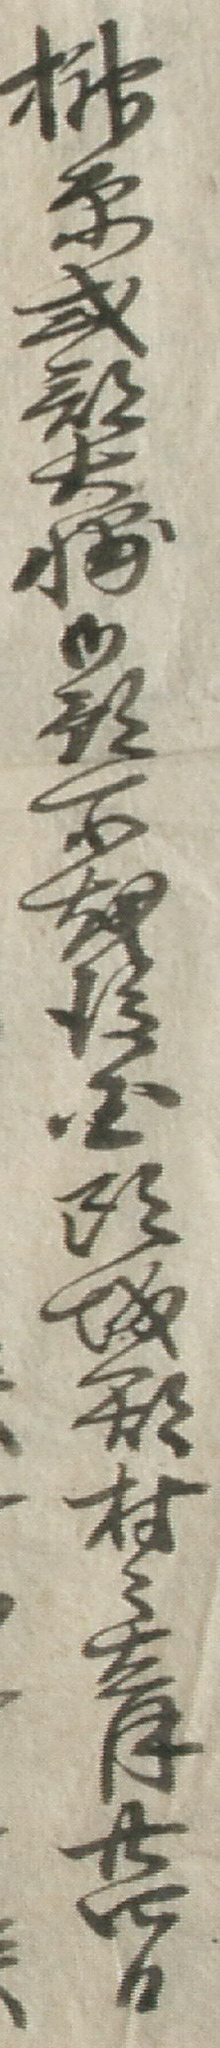榊原式部大輔御預所越後国頸城郡村々去月廿四日
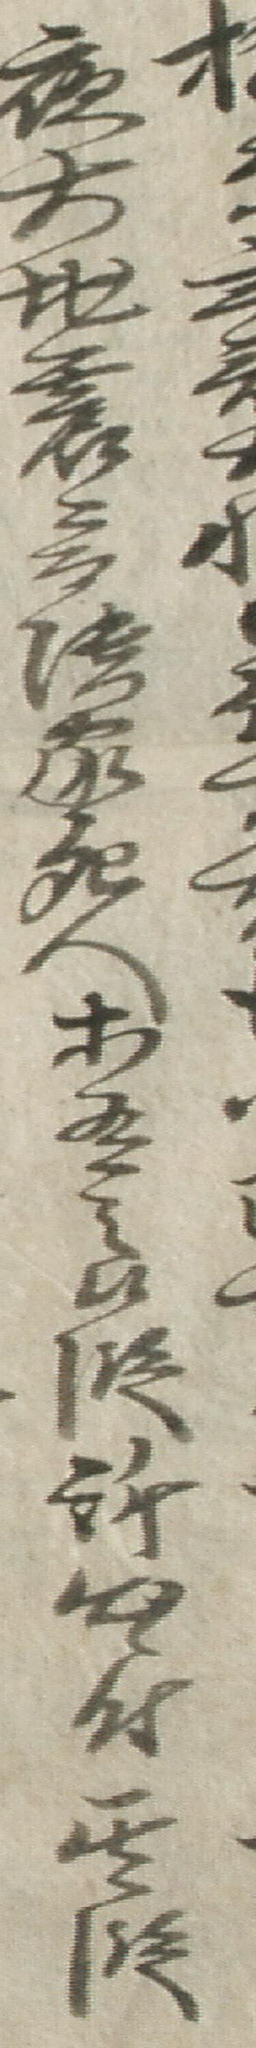震二而潰家死人等有之候段訴出候付其段
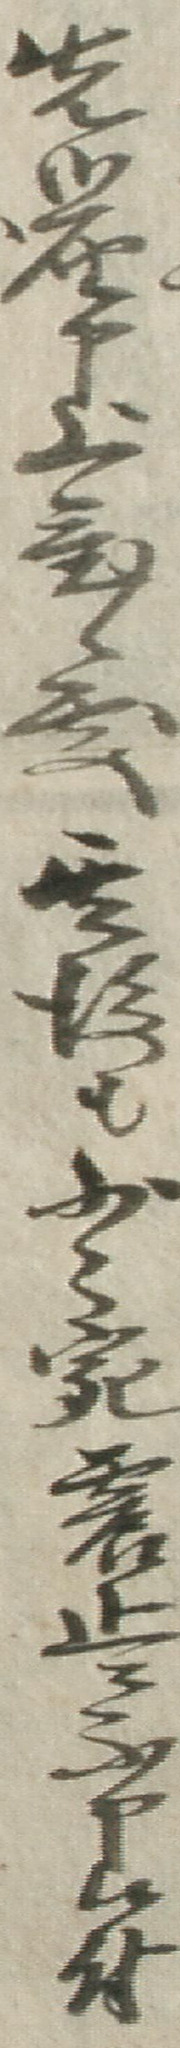先御届申上置候処其後も日々少々宛震止ミ不申候付
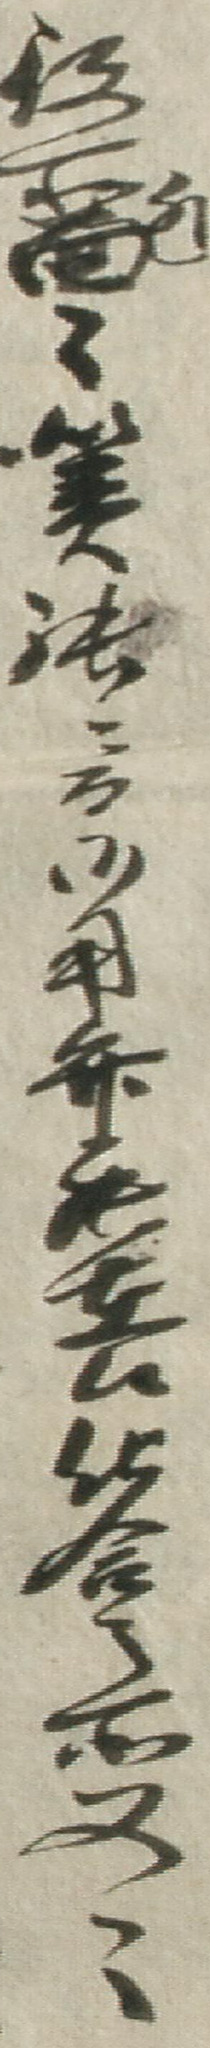役所外面々簀張二而御用弁罷在候仕合之所又々
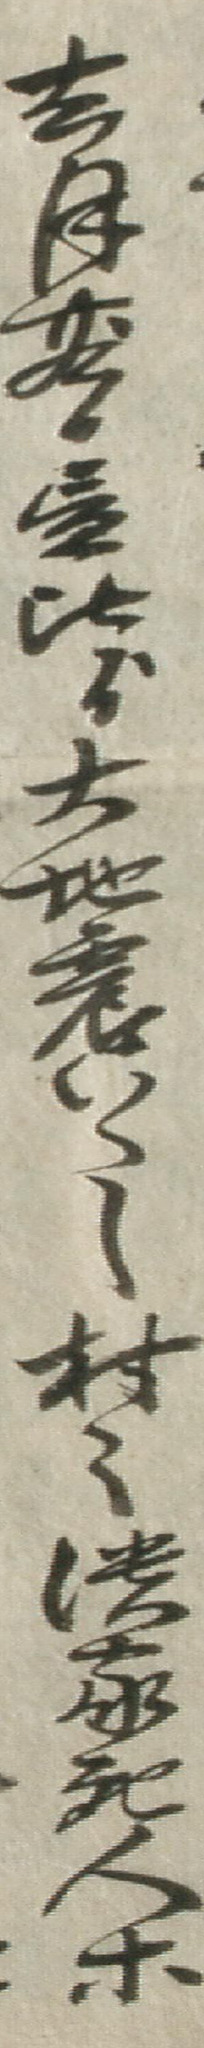去月廿九日昼比ゟ大地震いたし村々潰家死人
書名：信濃國地震實録記
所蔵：東京大学地震研究所図書室 Earthquake Research Institute Library, The University of Tokyo, JAPAN
